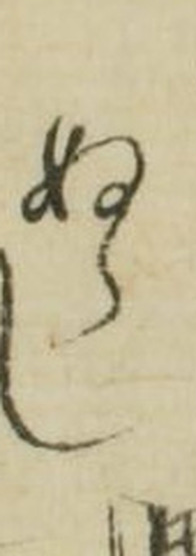ぬらし
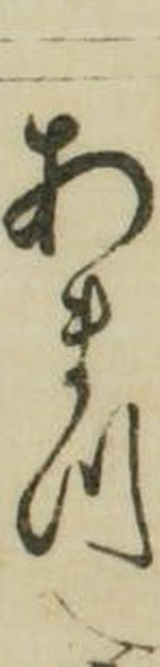あまつ
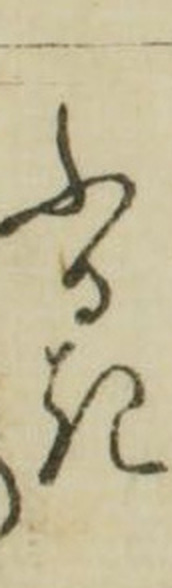ふるき
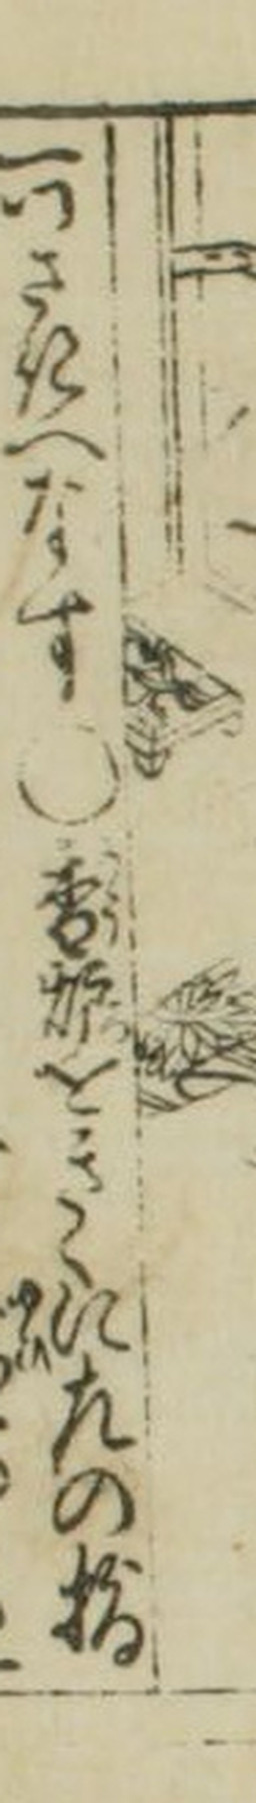一つさきへなす○香炉をきくに左の指
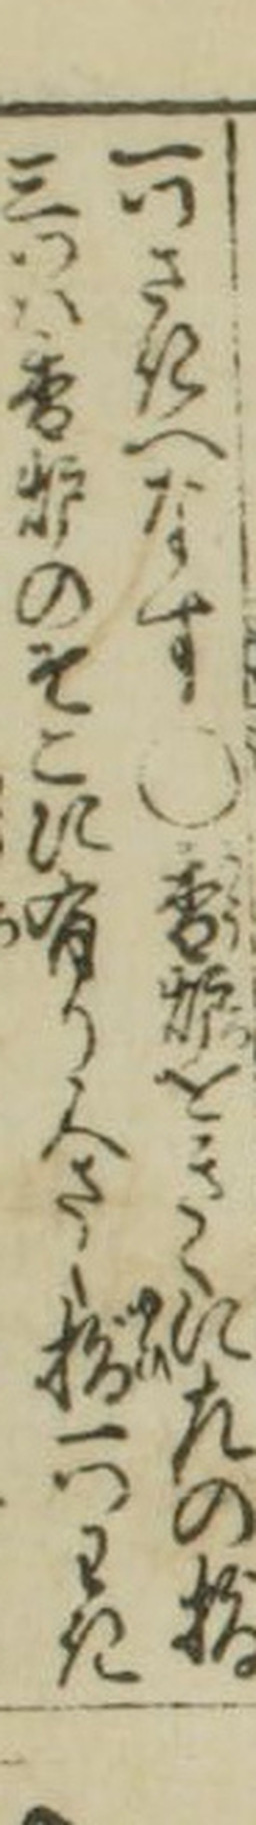三つは香炉のそこに有り人さし指一つわき
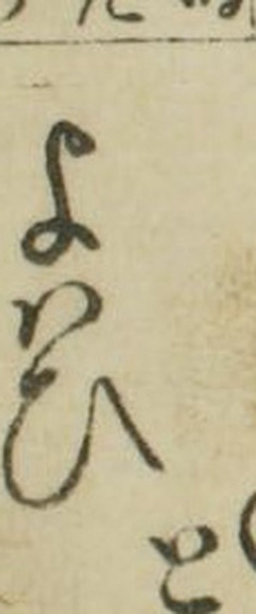よはひ
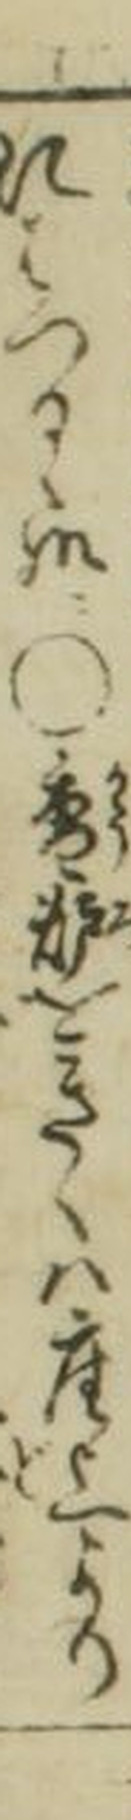にはつるゝ様に◯香炉をきくは座上より
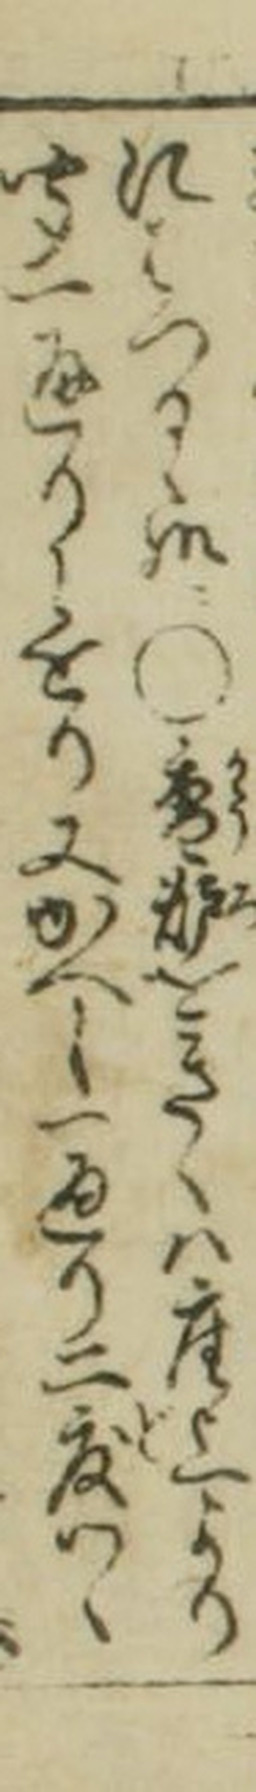聞一通りしをり又かへし一通り二度つゝ
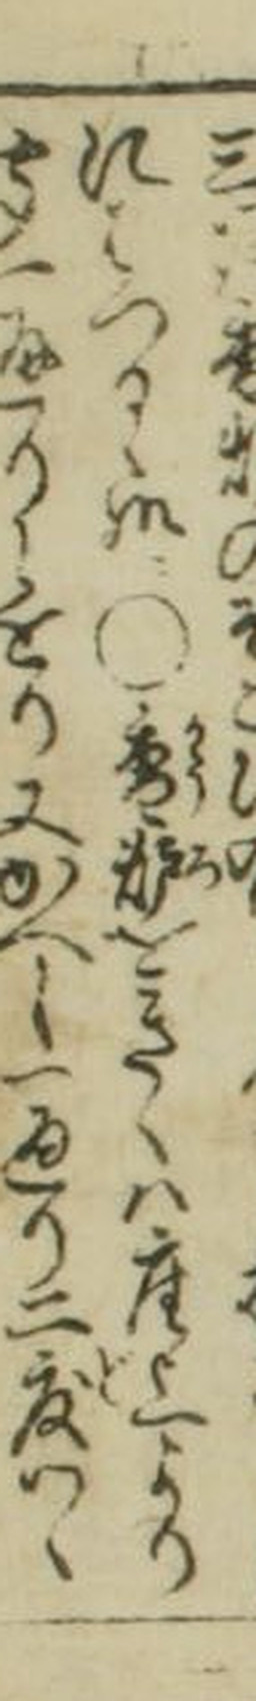聞一通りしをり又かへし一通り二度つゝ
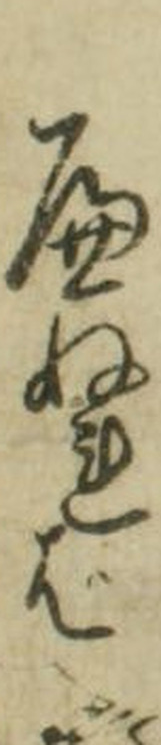へぬれば
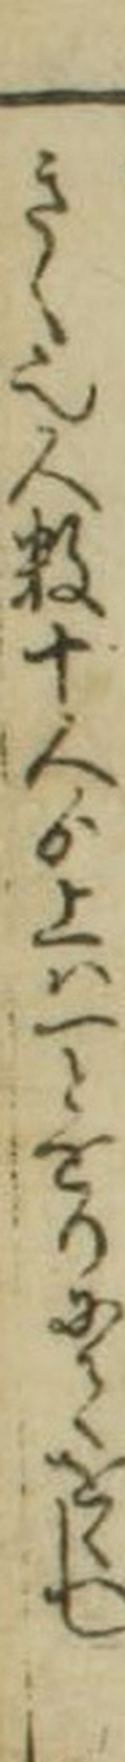きく也人数十人より上は一とをりにてをくべし

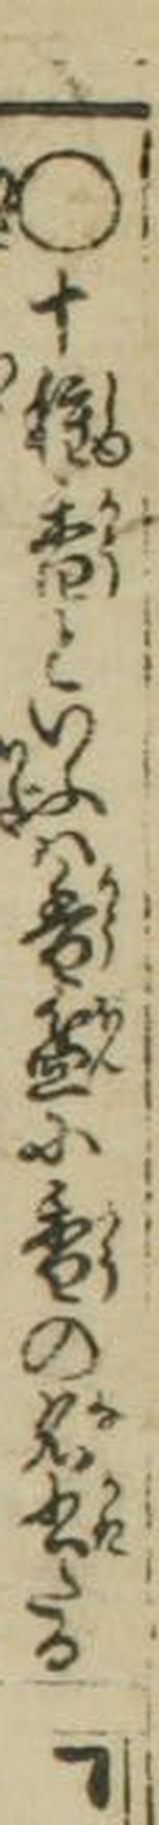○十種香といふは香盆に香の名書たる
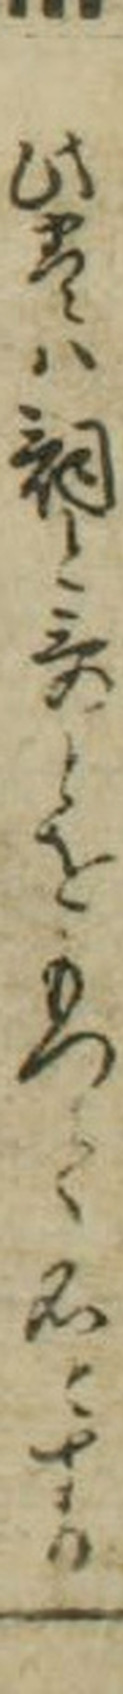此巻は詞と哥とをもつて名とする
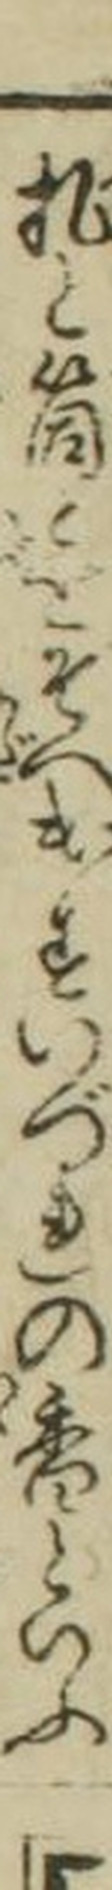札と筒とをそへ出すいづれの香といふ
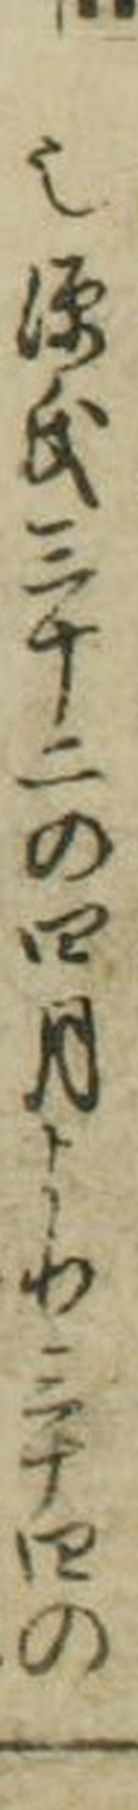也源氏三十二の四月より三十四の
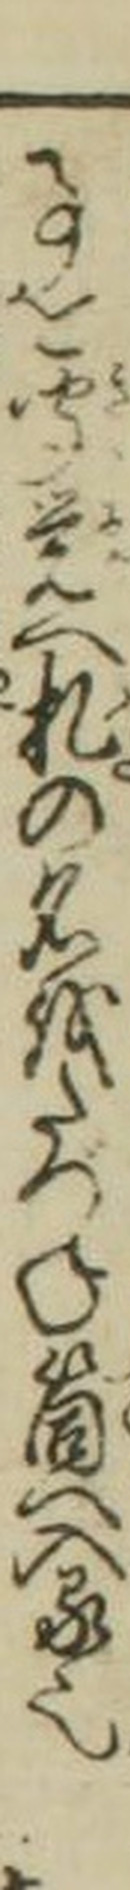事を聞覚へ札の名をたづね筒へ入る也
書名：女源氏教訓鑑
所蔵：東京学芸大学附属図書館
